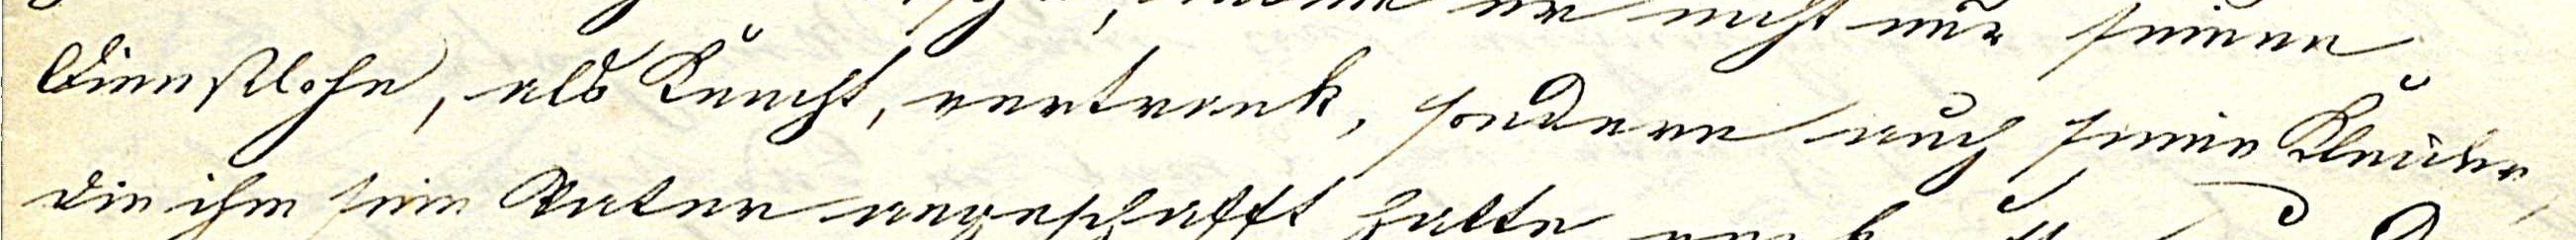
Dienstlohn, als Knecht, vertrank, sondern auch seine Kleider
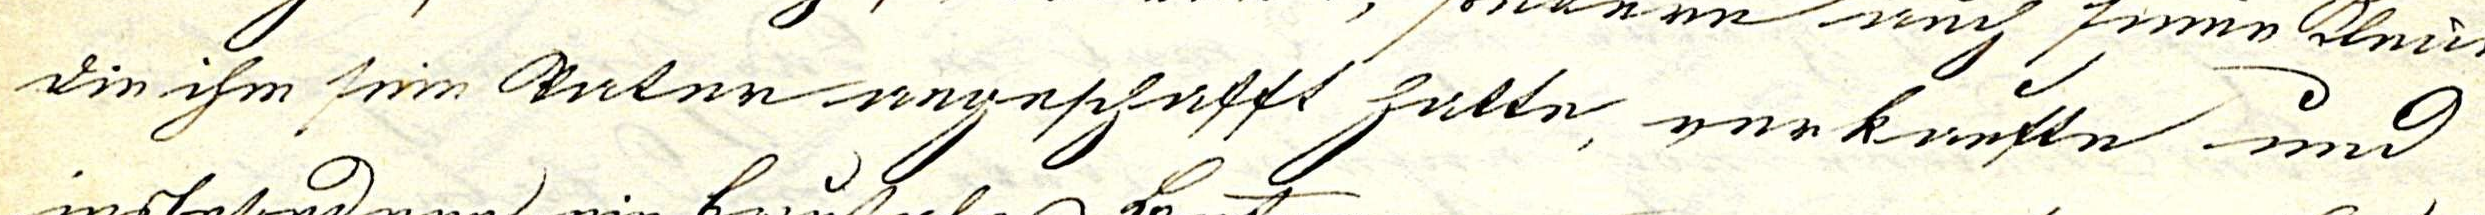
die ihm sein Vater angeschafft hatte, verkaufte und
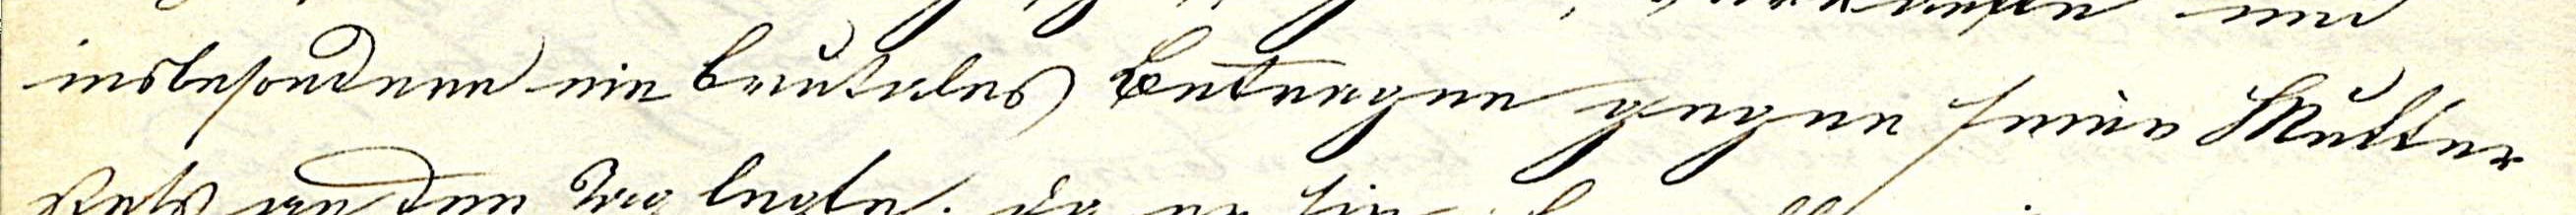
insbesondere ein brutales Betragen gegen seine Mutter
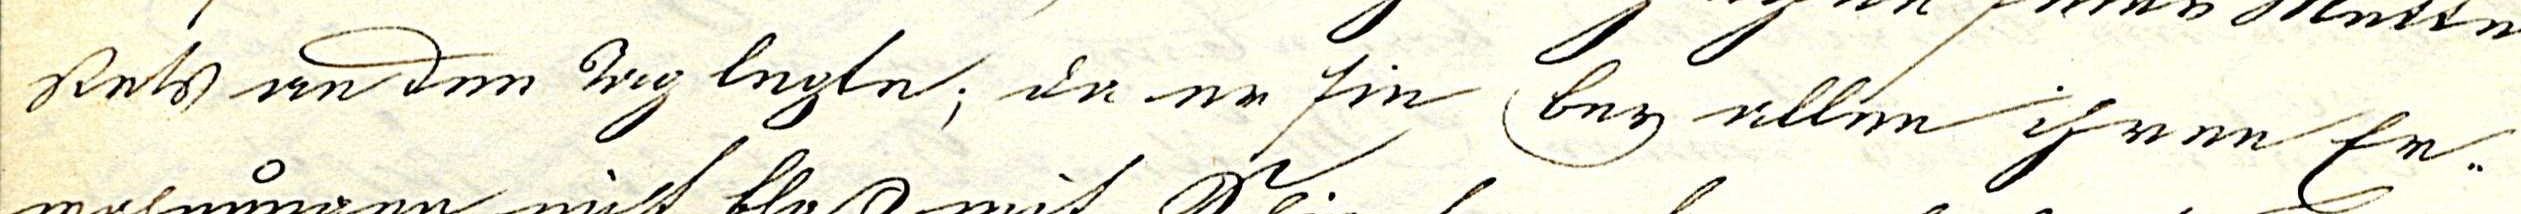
stets an de Tag legte; da er sie bey allem ihren Er¬
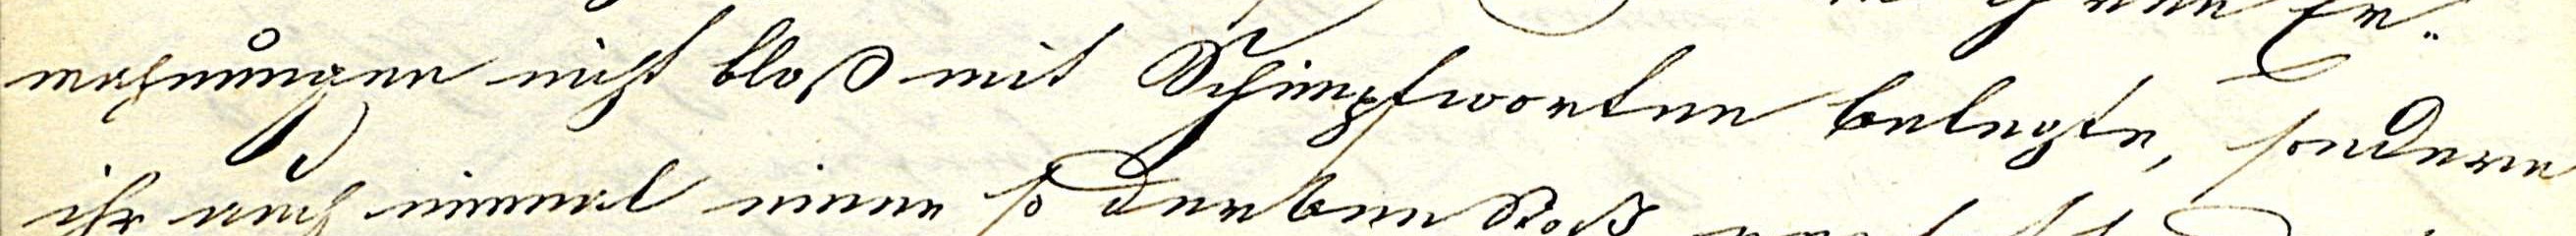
mahnungen nicht bloß mit Schimpfworten belegte, sondenr
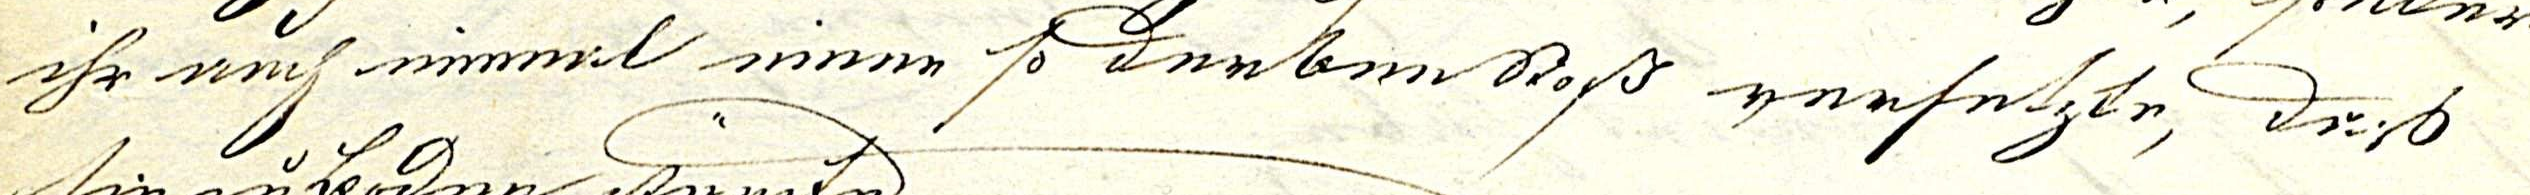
ihr auch einmal einen so derben Stoß versetzte, daß
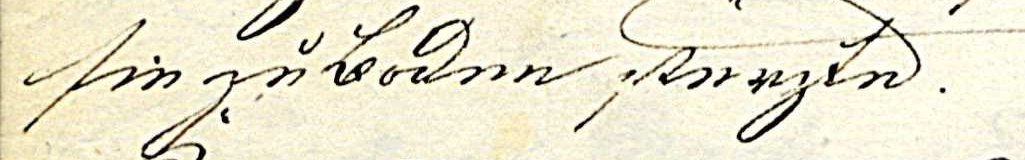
sie zu Boden stürzte.
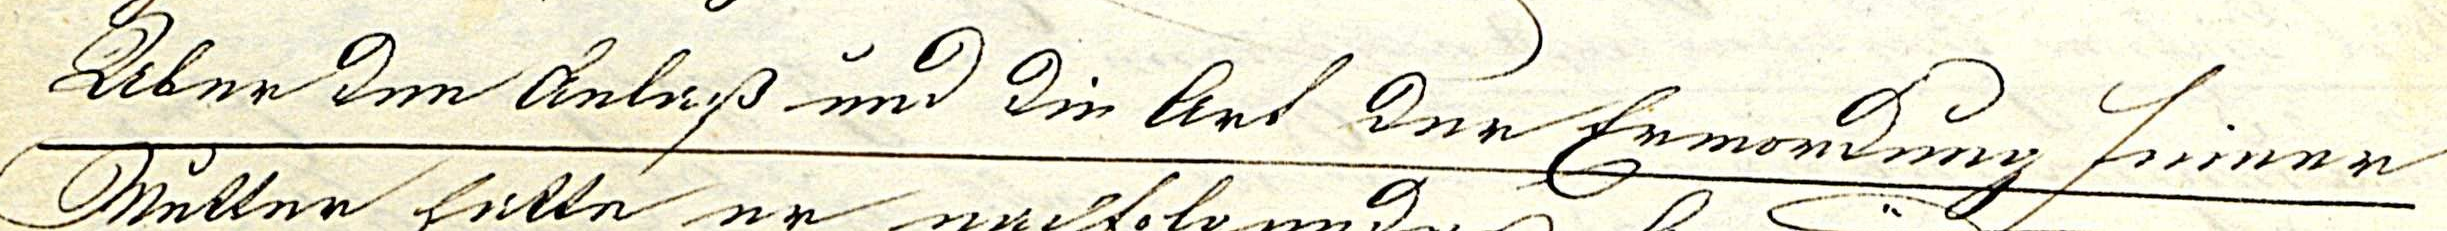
Über den Anlaß und die Art der Ermordung seiner
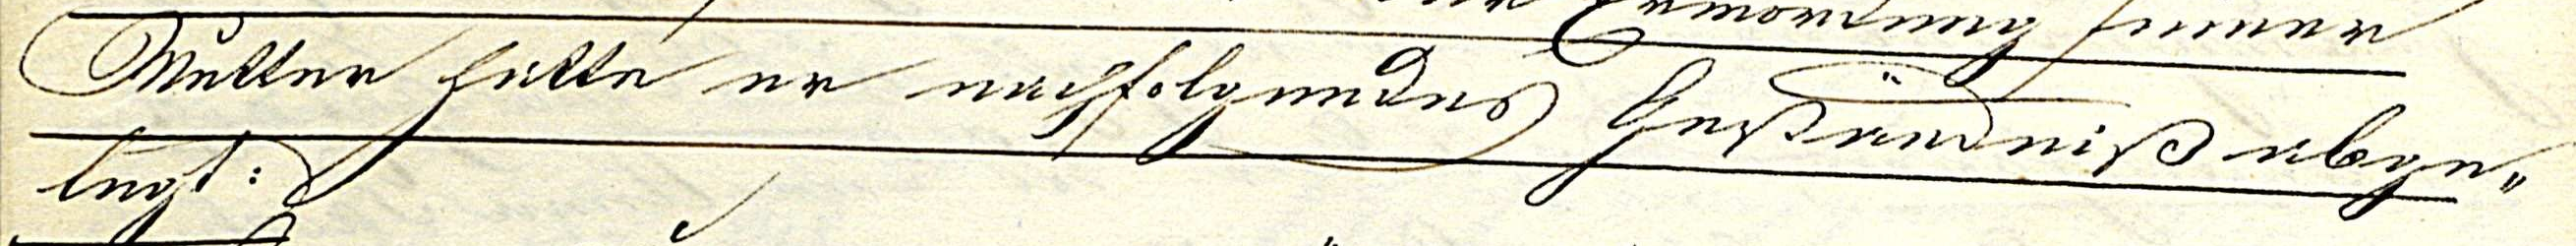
utter hatte er nachfolgendes Geständniß abge¬
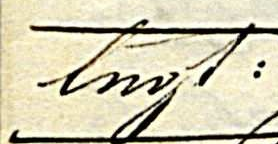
legt:
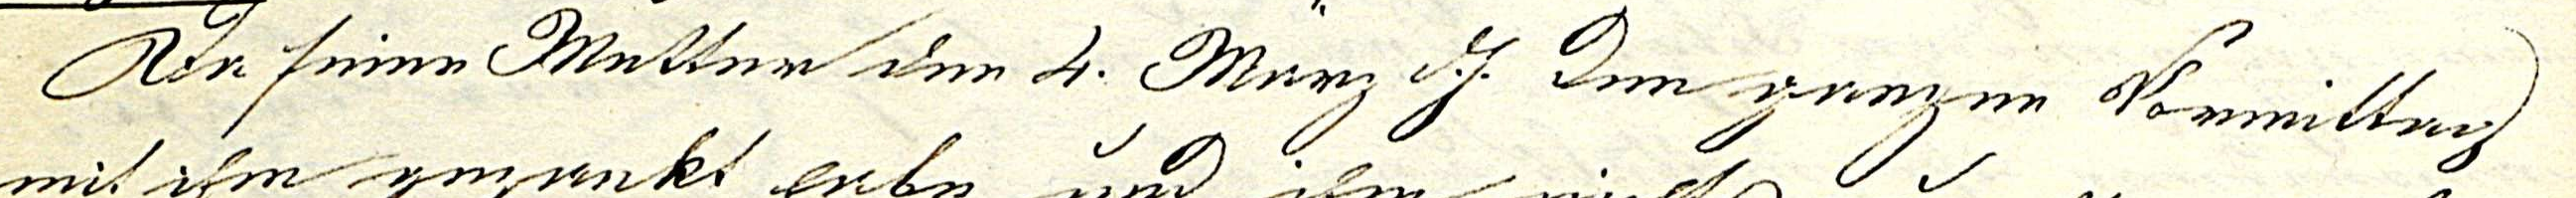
Da seine Mutter den 4 März d.J. dem ganzen Vormittag
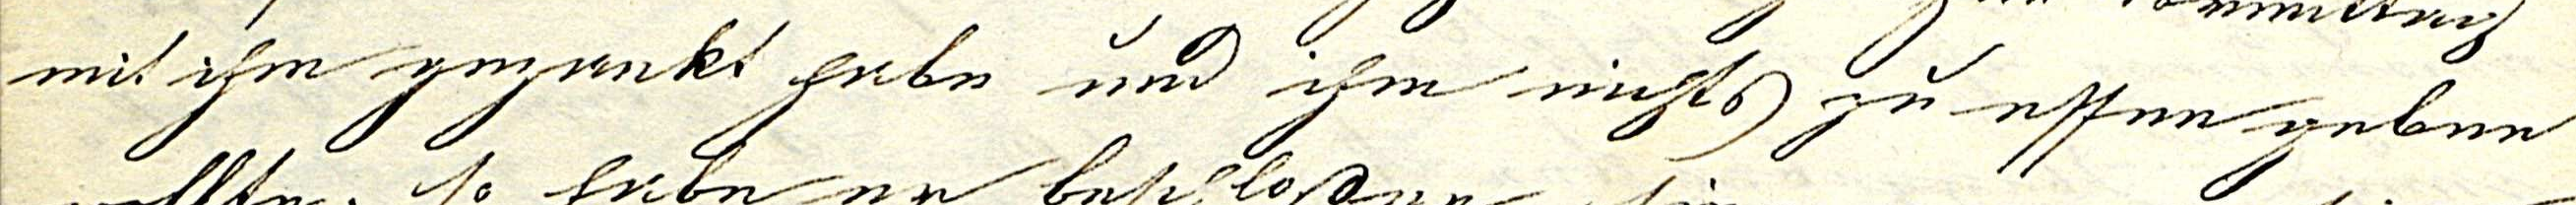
mit ihm gezankt habe und ihm nichts zu essen geben
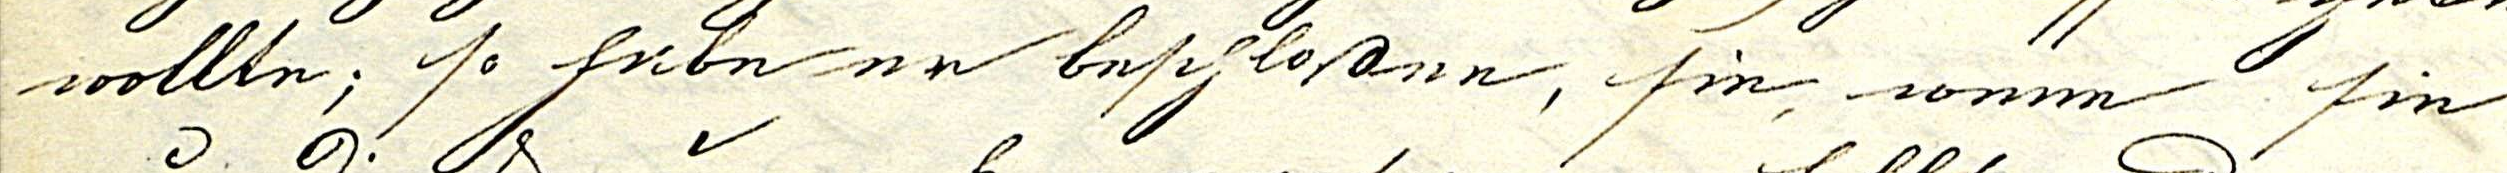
wollte; so habe er beschloßen, sie, wenn sie
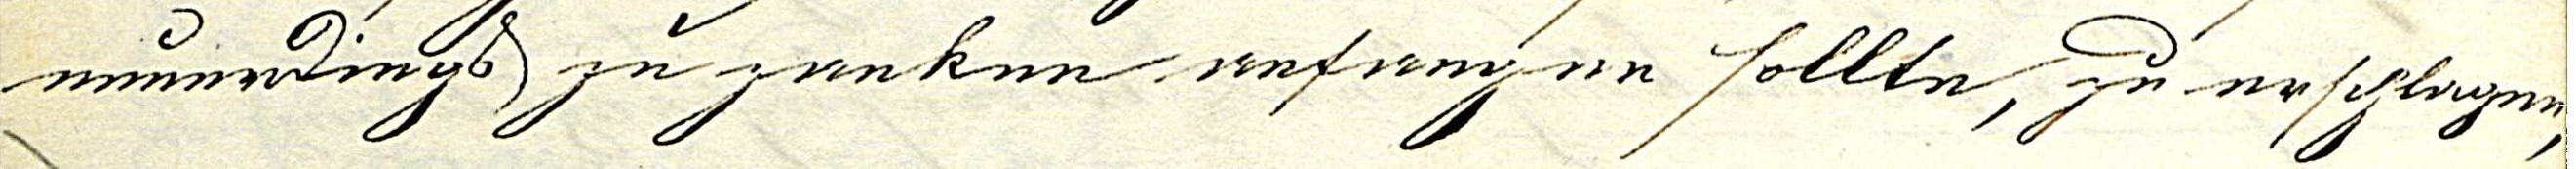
nuerdings zu zanken anfangen sollte, zu erschlagen,
